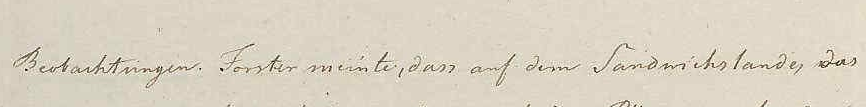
Beobachtungen. Forster meinte, dass auf dem Sandwichslande, wdas
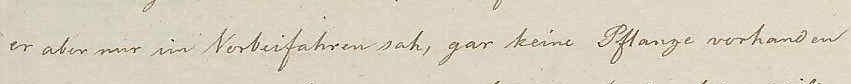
er aber nur im Vorbeifahren sah, gar keine Pflanze vorhanden
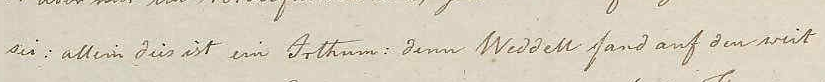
sei: allein dies ist ein Irthum: denn Weddell fand auf den weit
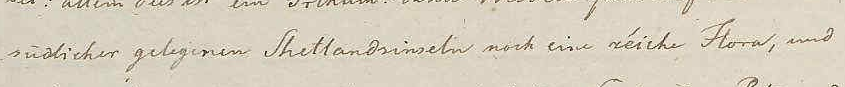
südlicher gelegenen Shetlandsinseln noch eine reiche Flora, und
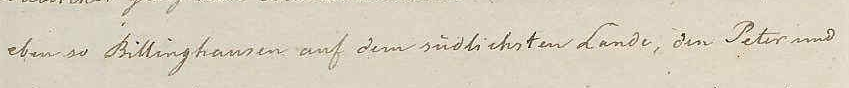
eben so Billinghausen auf dem südlichsten Lande, den Peter und
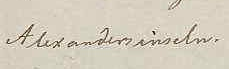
Alexandersinseln.
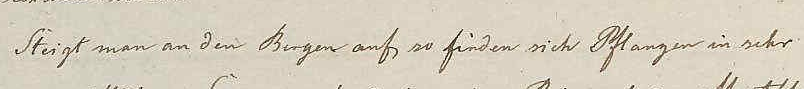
Steigt man an den Bergen auf, so finden sich Pflanzen in sehr
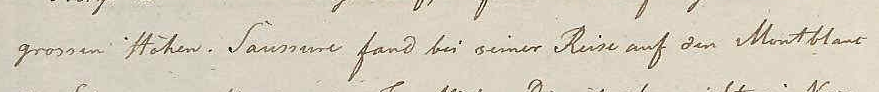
grossen Höhen. Saussure fand bei seiner Reise auf den Montblanc
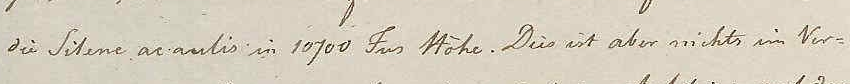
die Silene acaulis in 10700 Fus Höhe. Dies ist aber nichts im Ver-
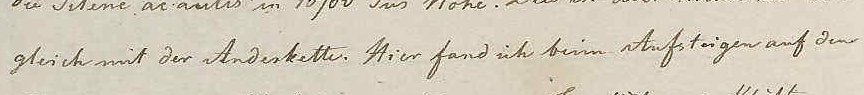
gleich mit der Andeskette. Hier fand ich beim Aufsteigen auf den
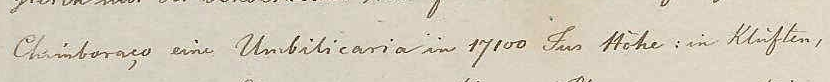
Chimboraço eine Umbilicaria in 17100 Fus Höhe: in Klüften,
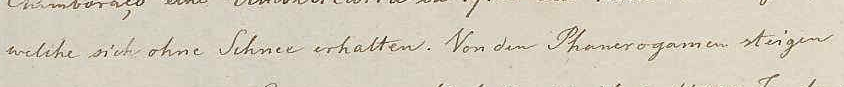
welche sich ohne Schnee erhalten. Von den Phanerogamen steigen
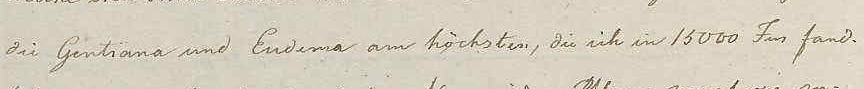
die Gentiana und Eudema am höchsten, die ich in 15000 Fus fand.
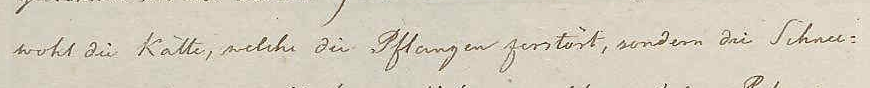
wohl die Kälte, welche die Pflanzen zerstört, sondern die Schnee-
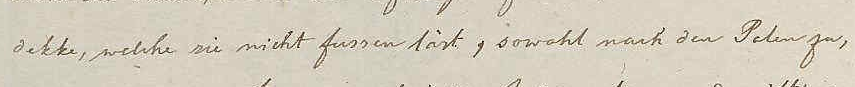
dekke, welche sie nicht fussen läst, sowohl nach den Polen zu,
